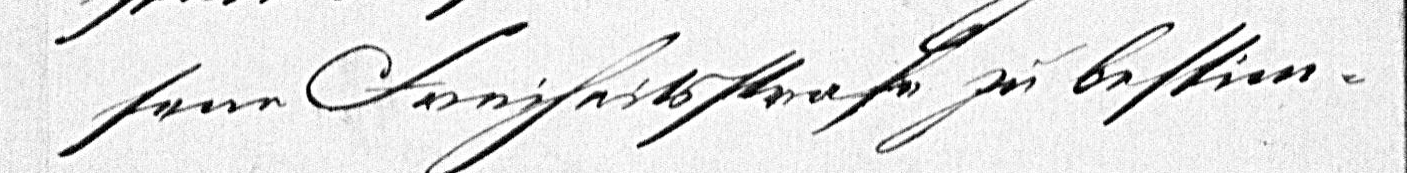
sene Freiheitsstrafe zu bestim¬
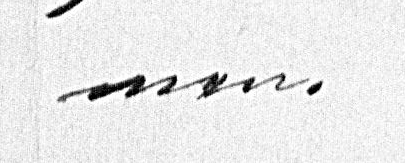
men.
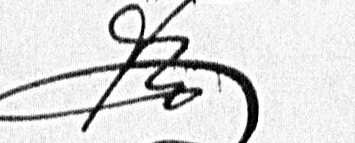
xx
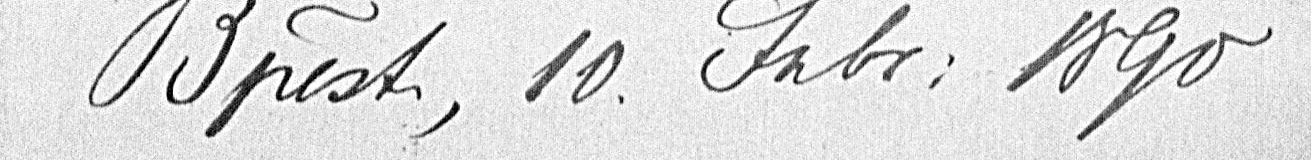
Bpest, 10. Febr. 1890
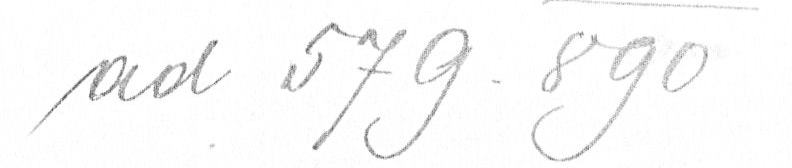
ad 579.890
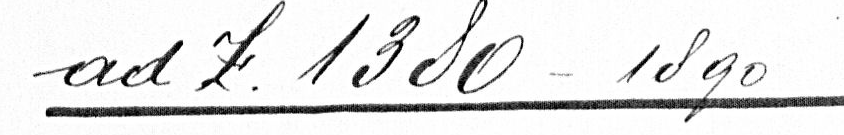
ad Z. 1380 - 1890
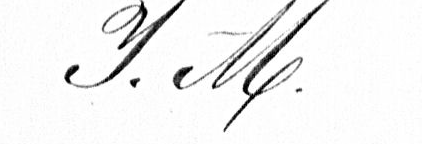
I.M.
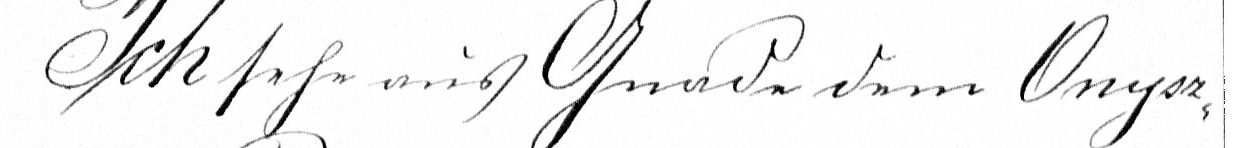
Ich sehe aus Gnade dem Onysz¬
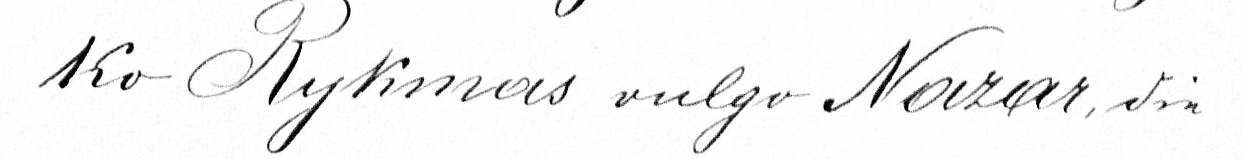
ko Rykmas vulgo Nazar, die
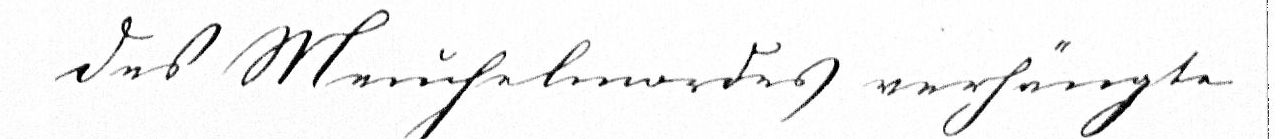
des Meuchelmordes verhängte
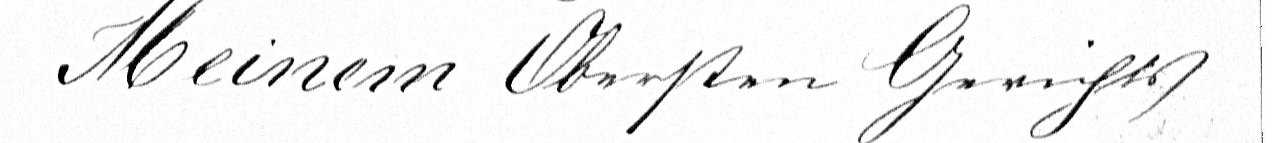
Meinem Obersten Gerichts
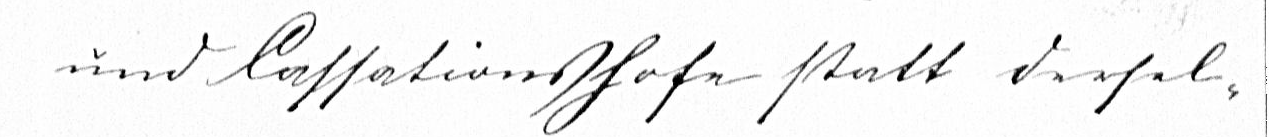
und Cassationshofe statt dersel¬
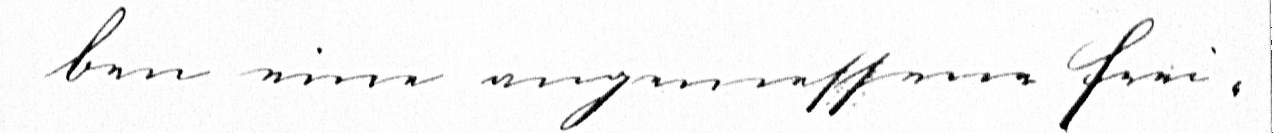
ben eine angemessene Frei¬
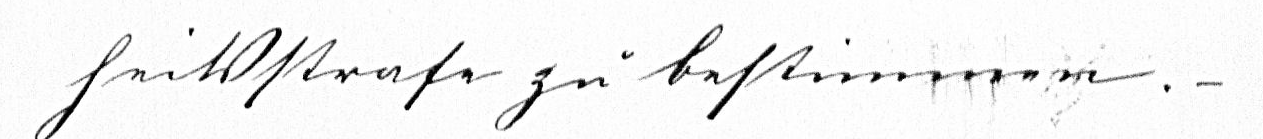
heitsstrafe zu bestimmen.-
